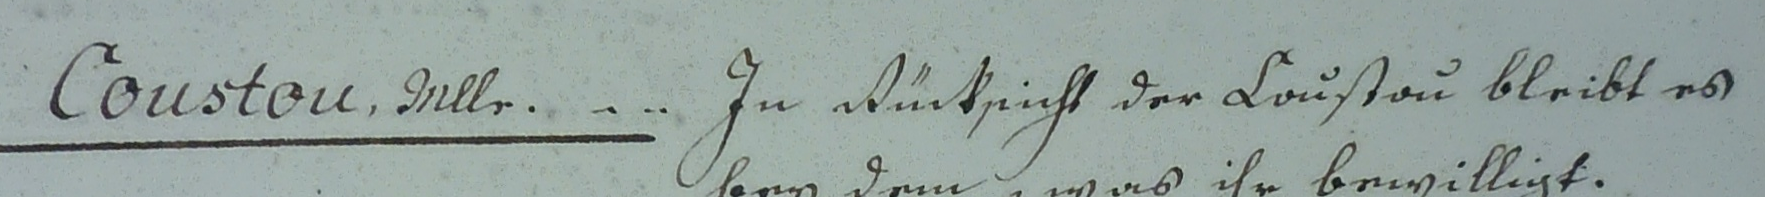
Coustou, Mlle. .. .. In Rücksicht der Coustuu bleibt es
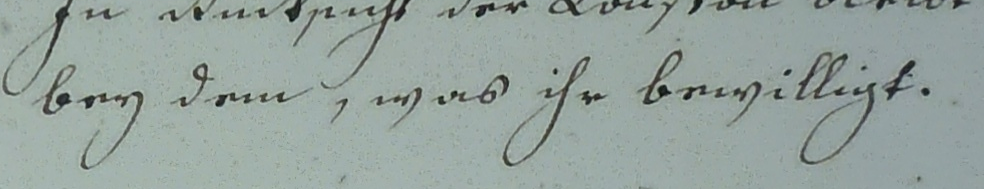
bey dem, was ihr bewilligt.
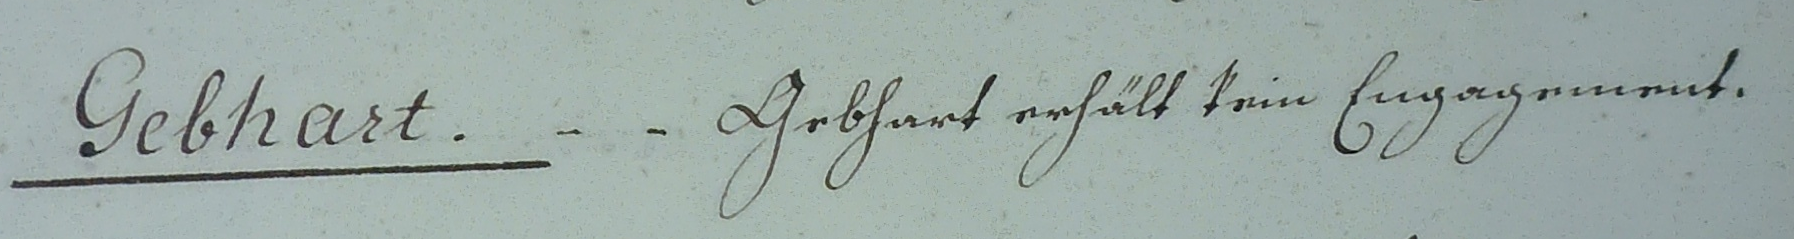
Gebhart. .. .. Gebhart erhält kein Engagement.
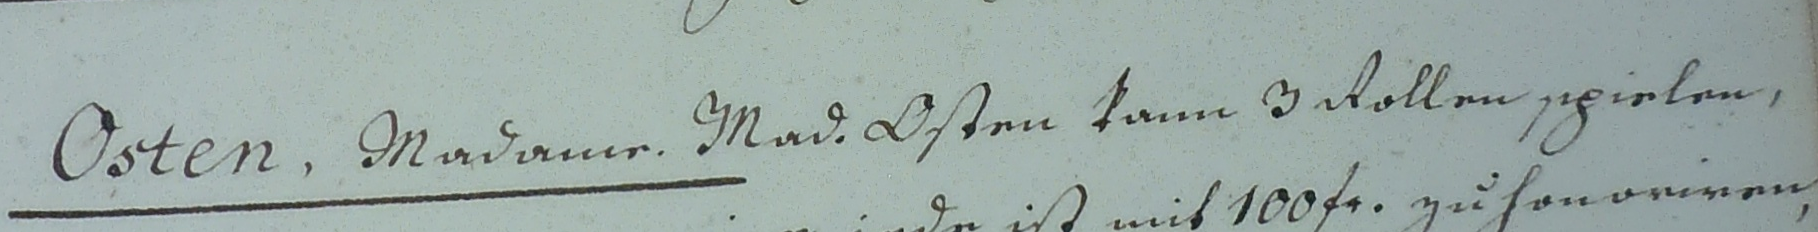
Osten, Madame. Mad. Osten kann 3 Rollen spielen,
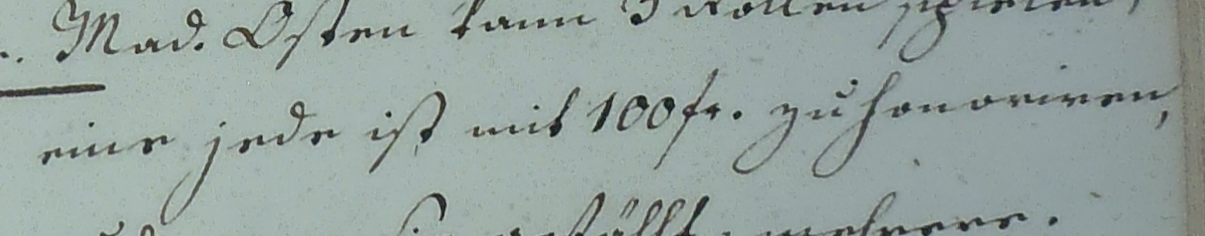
eine jede ist mit 100fr. zuhonoriren,
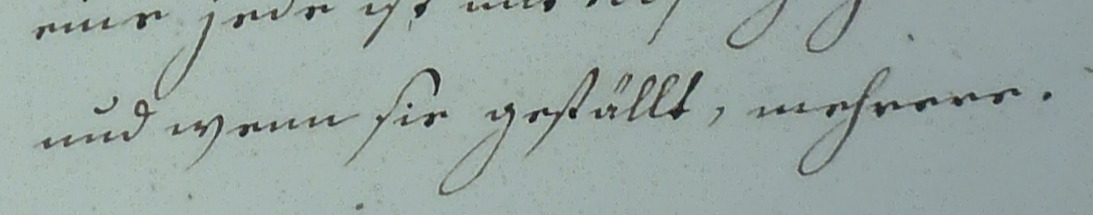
und wenn sie gefällt, mehrere.
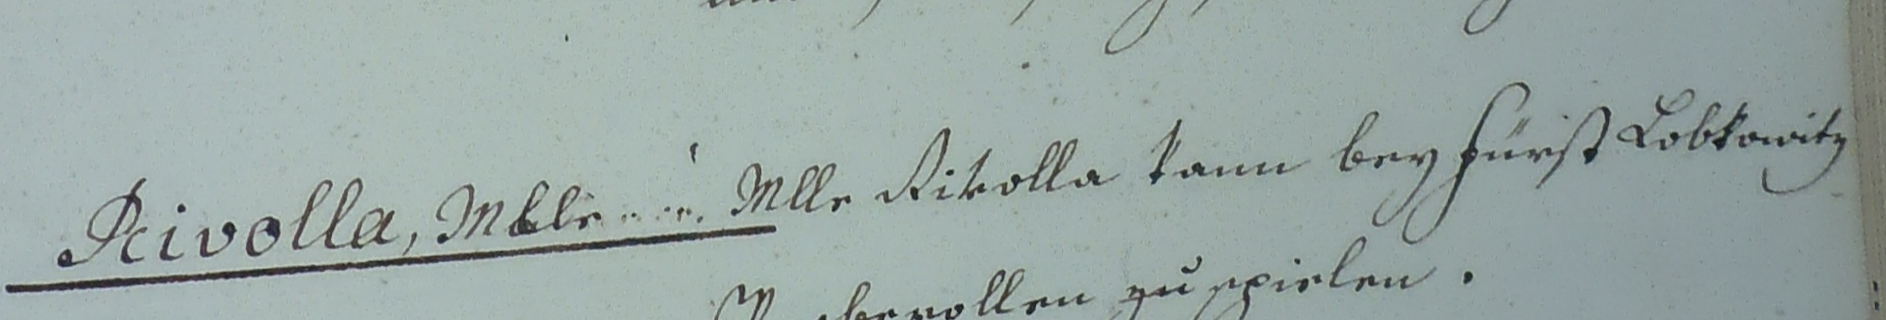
Rivolla, Mlle .. .. Mlle Rivolla kann bey Fürst Lobkowitz
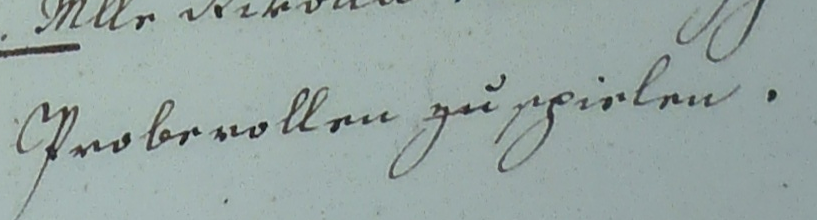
Proberollen zuspielen.
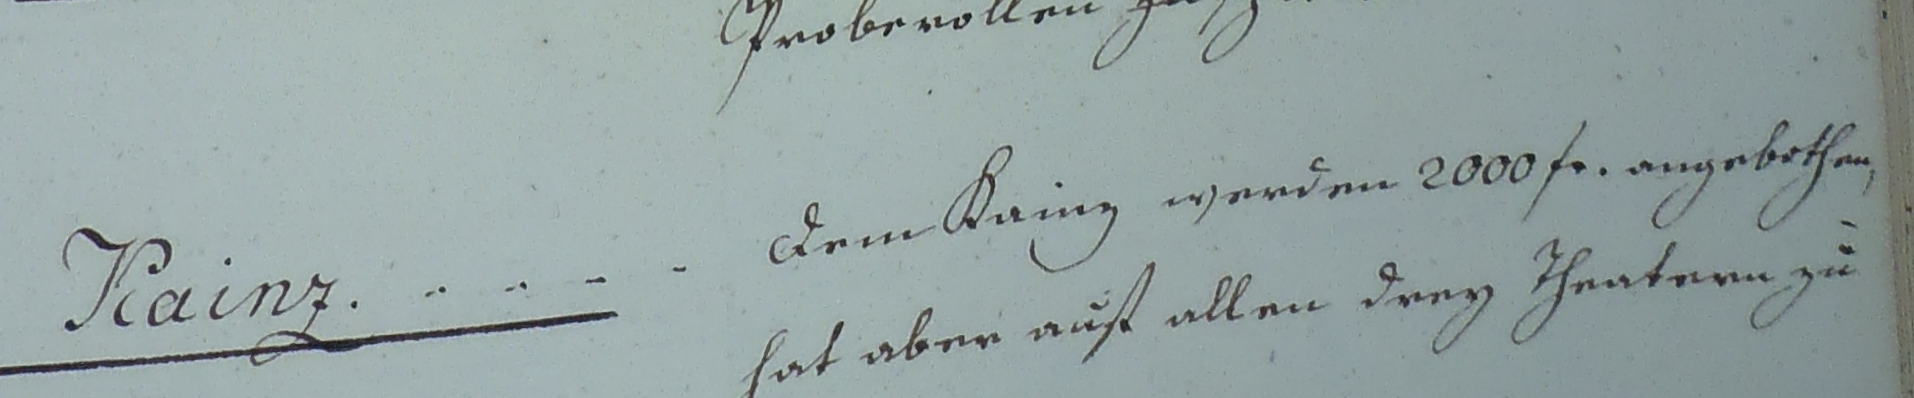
Kainz. .. .. .. .. Dem Kainz werden 200fr. angebothen,
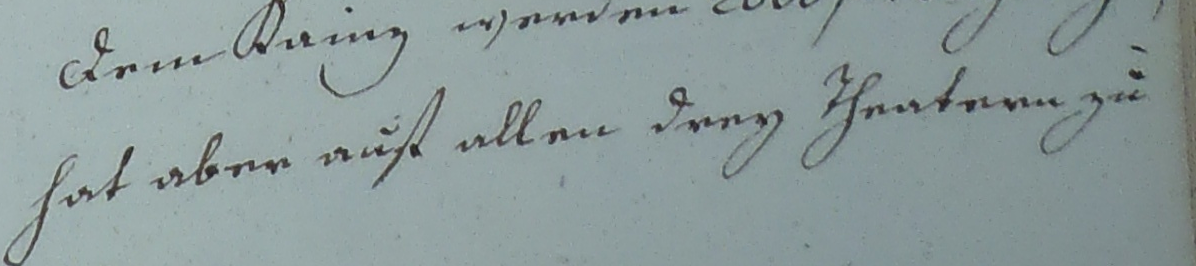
hat aber auf allen drey Theatern zu
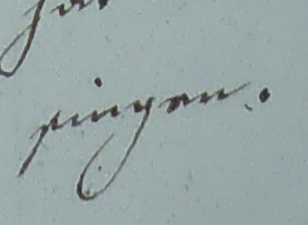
singen.
